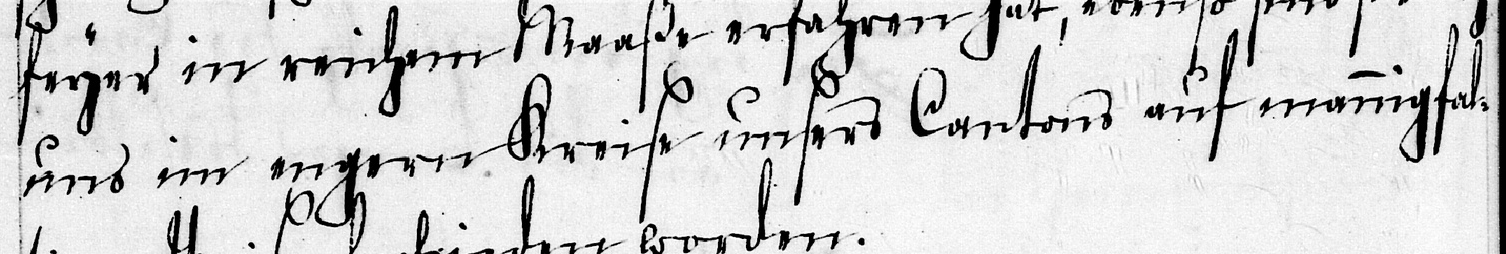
uns im engern Kreise unsers Cantons auf mannigfal¬
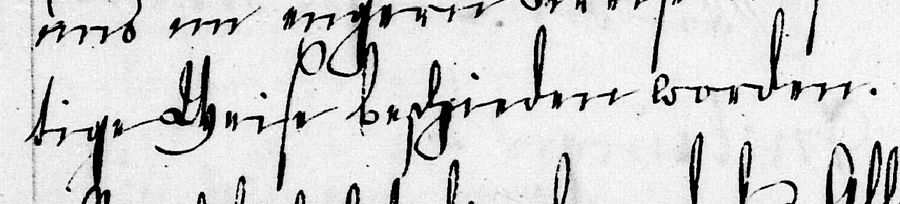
tige Weise beschieden worden.
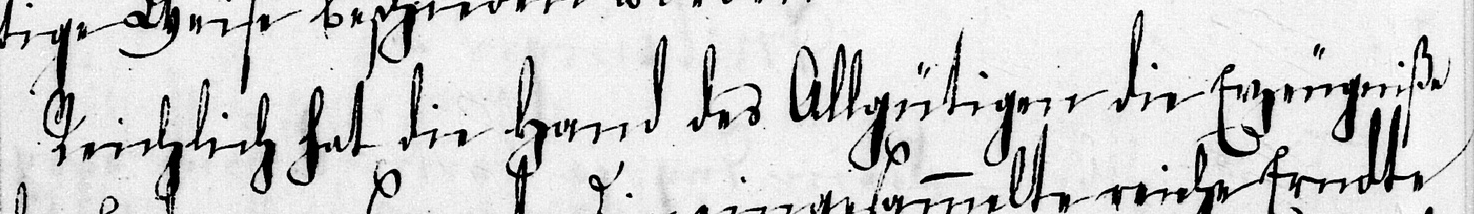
Reichlich hat die Hand des Allgütigen die Erzeugniße
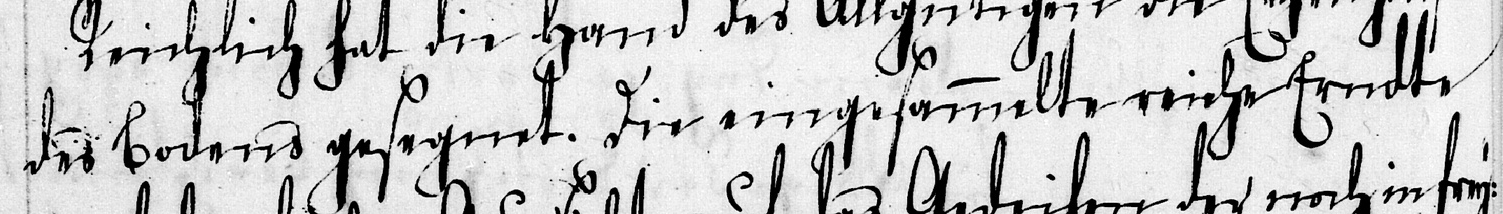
des Bodens gesegnet. Die eingesammelte reiche Erndte
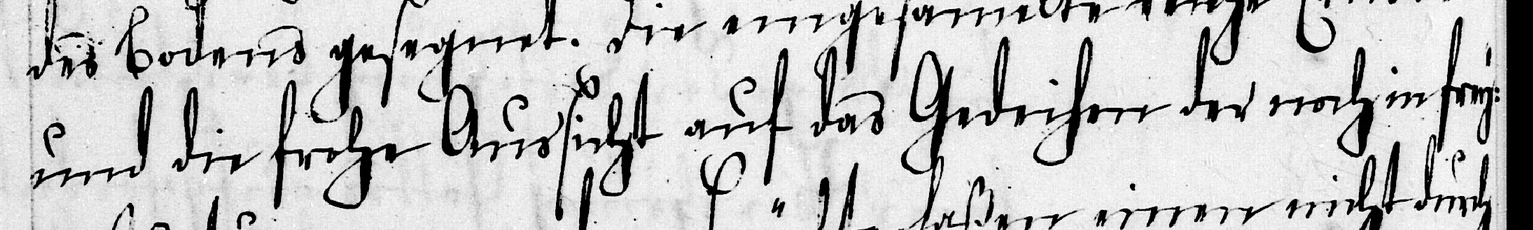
und die frohe Aussicht auf das Gedeihen der noch in f¬
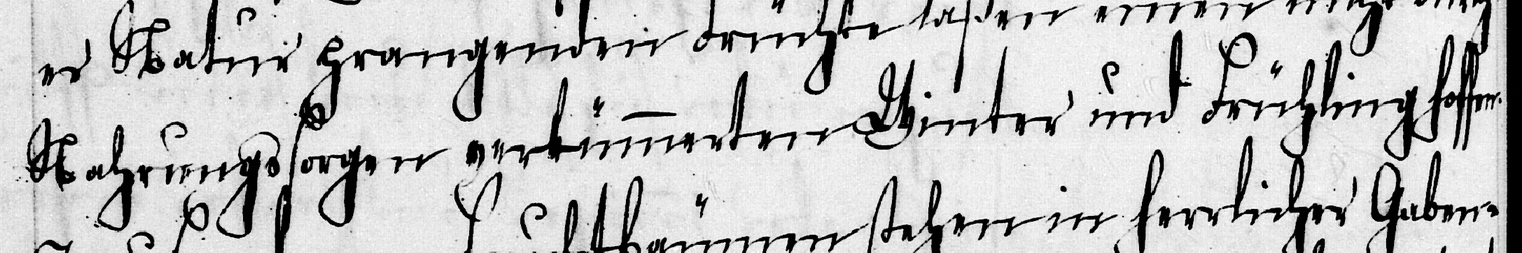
Nahrungssorgen verkümmerten Winter und Frühling hof¬
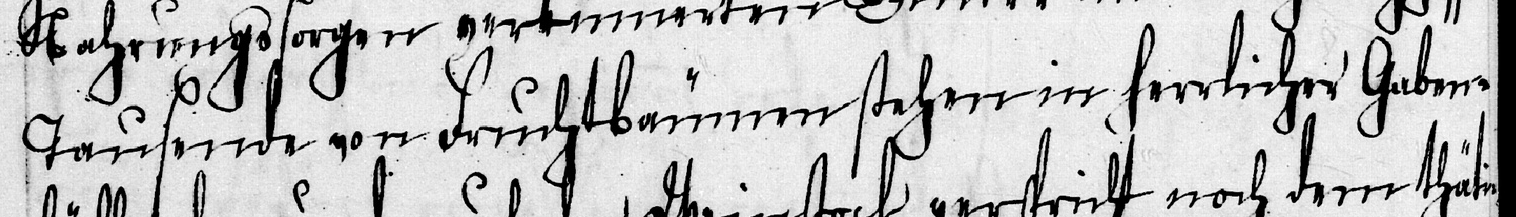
Tausende von Fruchtbäumen stehen in herrlicher Gaben¬
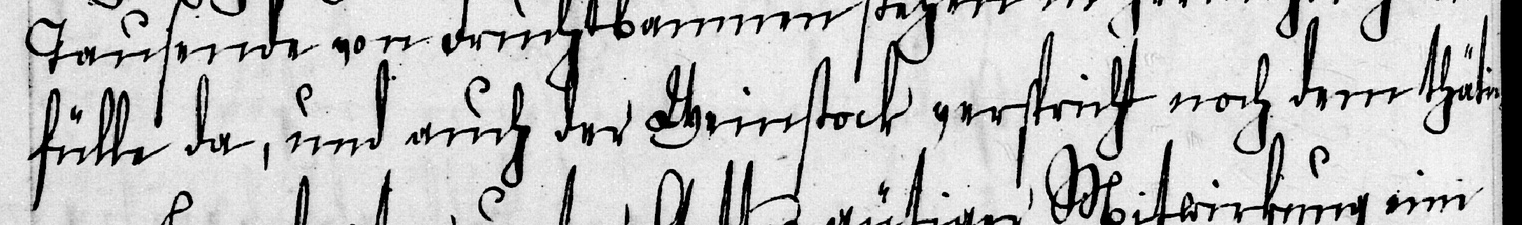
fülle da, und auch der Weinstock verspricht noch dem thäti¬
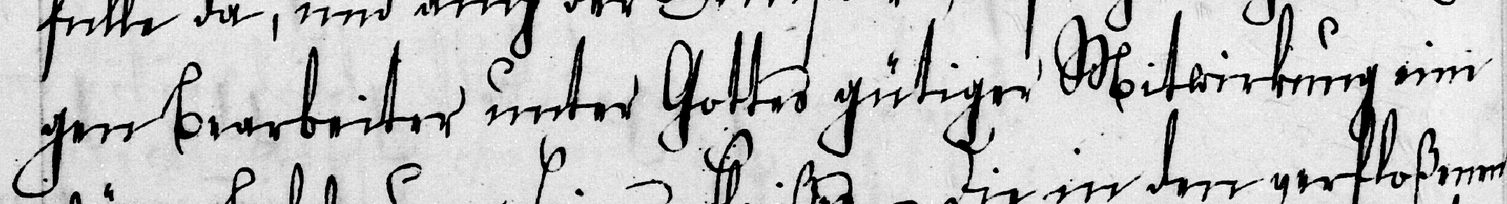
gen Bearbeiter unter Gottes gütiger Mitwirkung eine
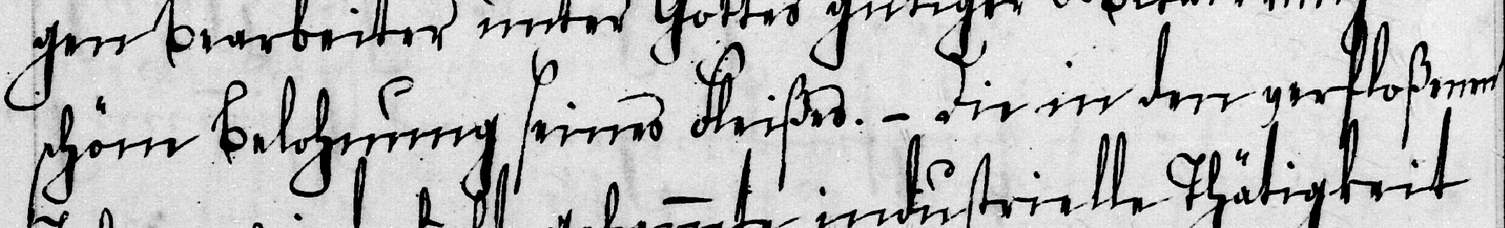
schöne Belohnung seines Fleißes. – Die in den verfloßenen
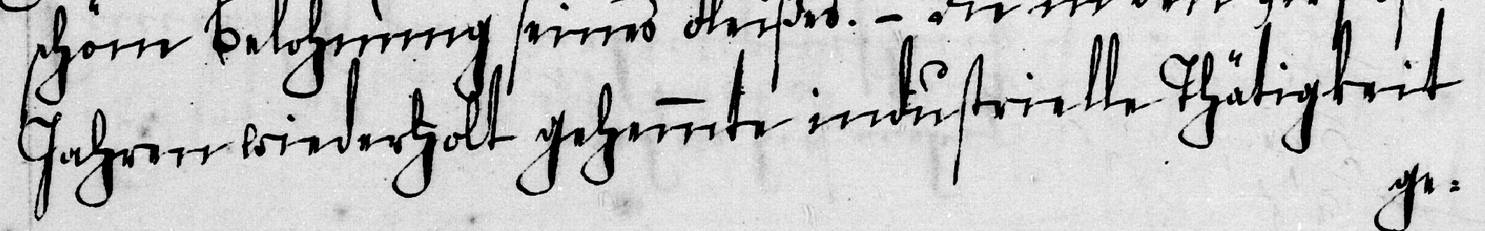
Jahren wiederholt gehemmte industrielle Thätigkeit
